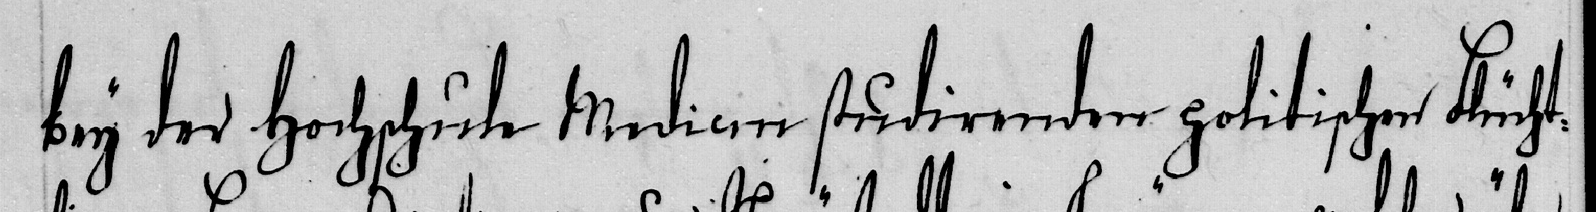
bey der Hochschule Medicin studirenden politischen Flüc¬
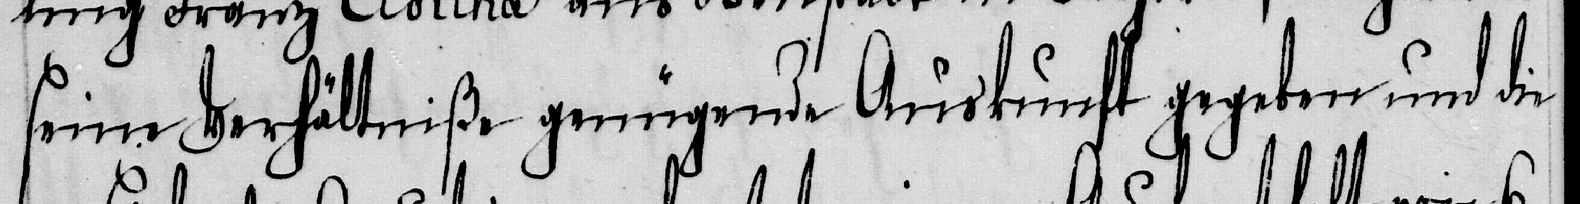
seine Verhältniße genügende Auskunft gegeben und die
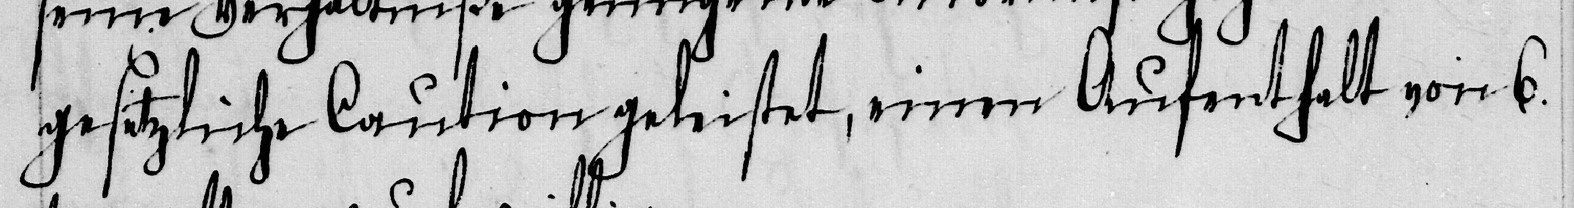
gesetzliche Caution geleistet, einen Aufenthalt von 6.
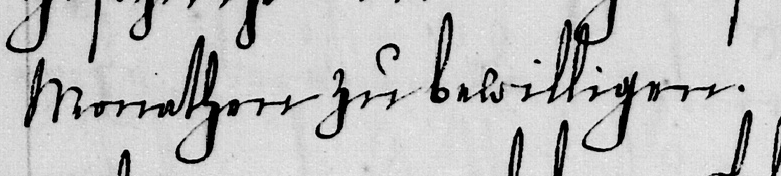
Monathen zu bewilligen.
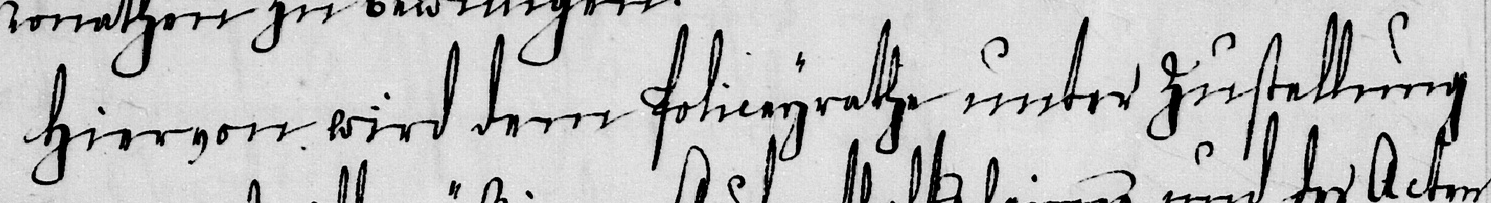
Hiervon wird dem Policeyrathe unter Zustellung
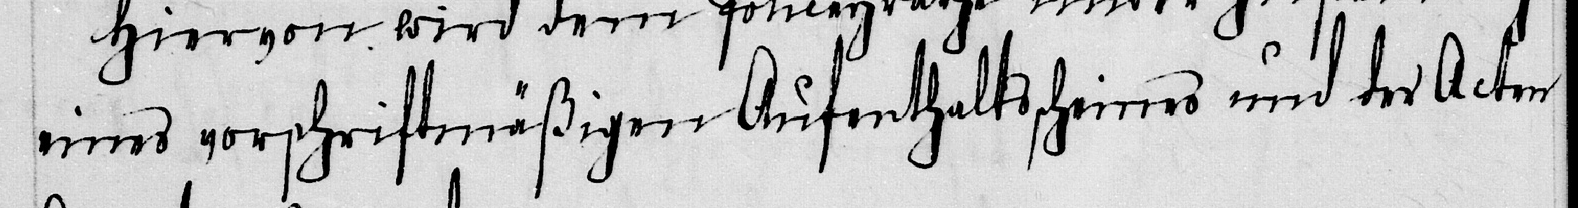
eines vorschriftmäßigen Aufenthaltsscheines und der Acten
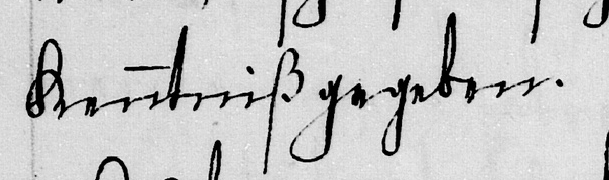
Kenntniß gegeben.
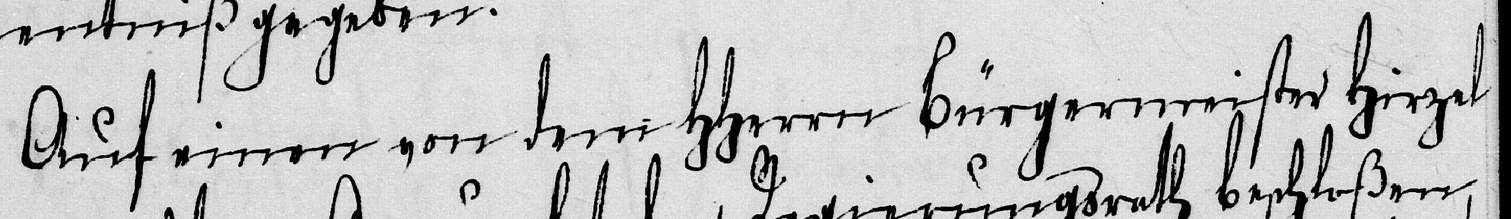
Auf einen von dem HHerrn Bürgermeister Hirzel
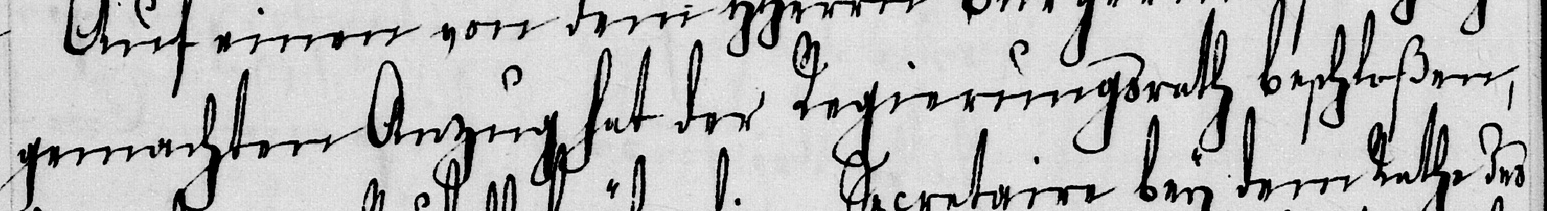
gemachten Anzug hat der Regierungsrath beschloßen,
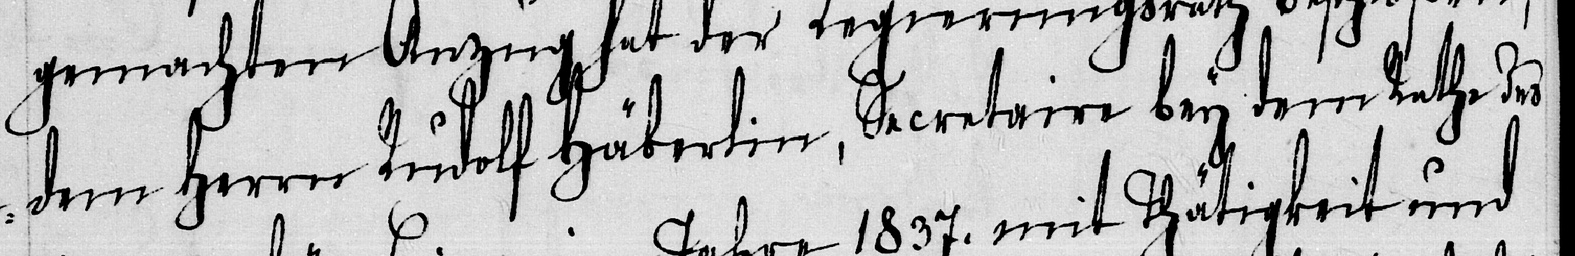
dem Herrn Rudolf Häberlin, Secretaire bey dem Rathe des
